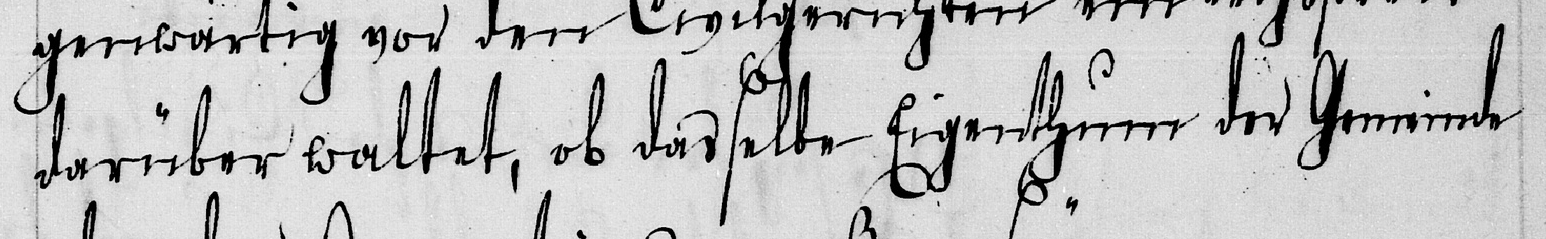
darüber waltet, ob dasselbe Eigenthum der Gemeinde
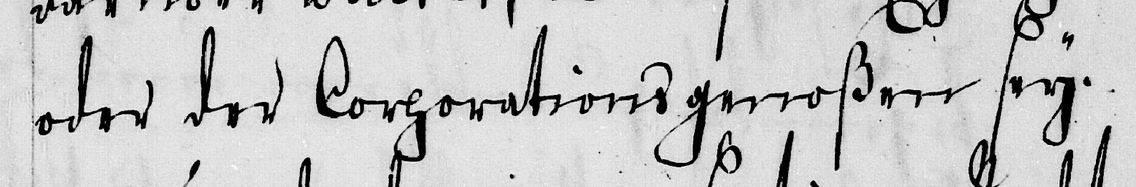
oder der Corporationsgenoßen sey.
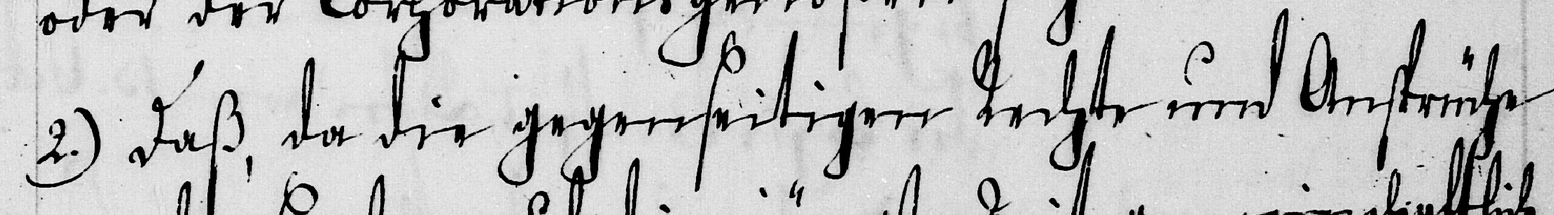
2.) Daß, da die gegenseitigen Rechte und Ansprüche
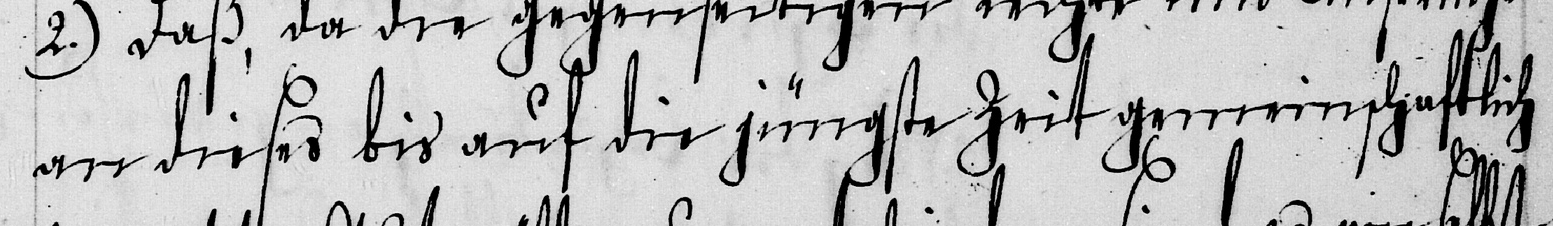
an dieses bis auf die jüngste Zeit gemeinschaftlich
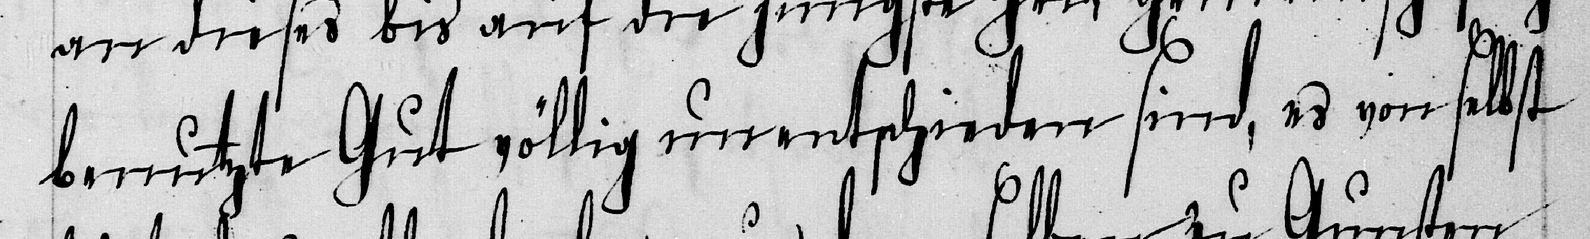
benutzte Gut völlig unentschieden sind, es von selbst
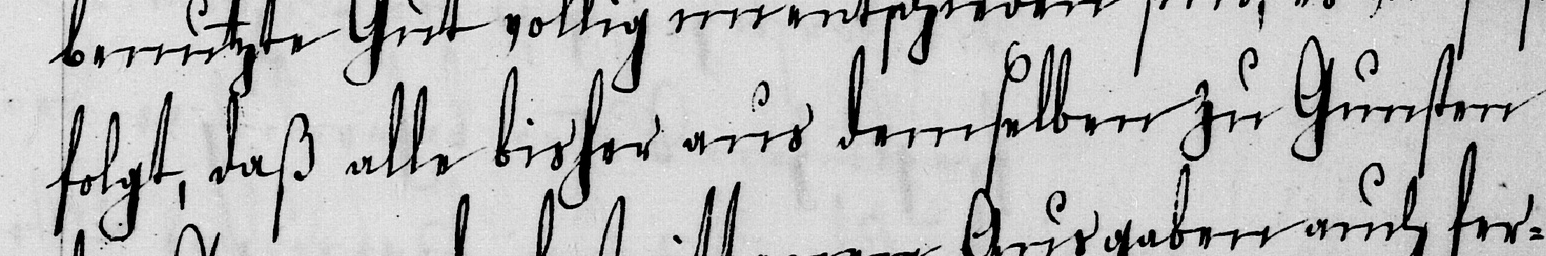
folgt, daß alle bisher aus demselben zu Gunsten
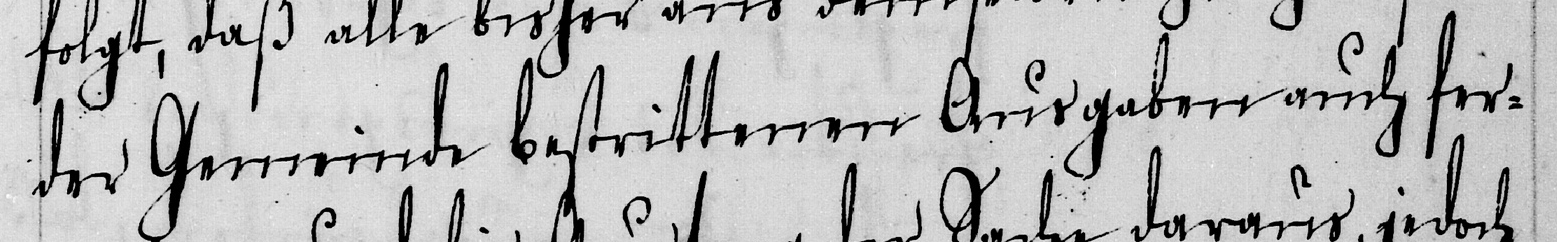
der Gemeinde bestrittenen Ausgaben auch fer¬
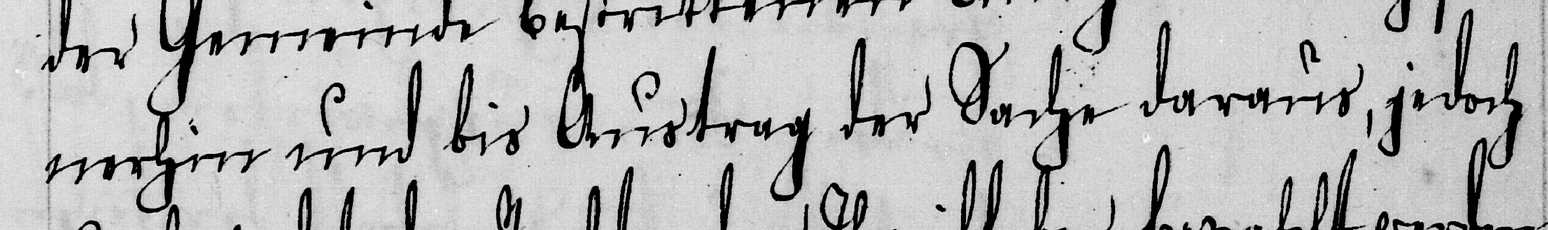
nerhin und bis Austrag der Sache daraus, jedoch
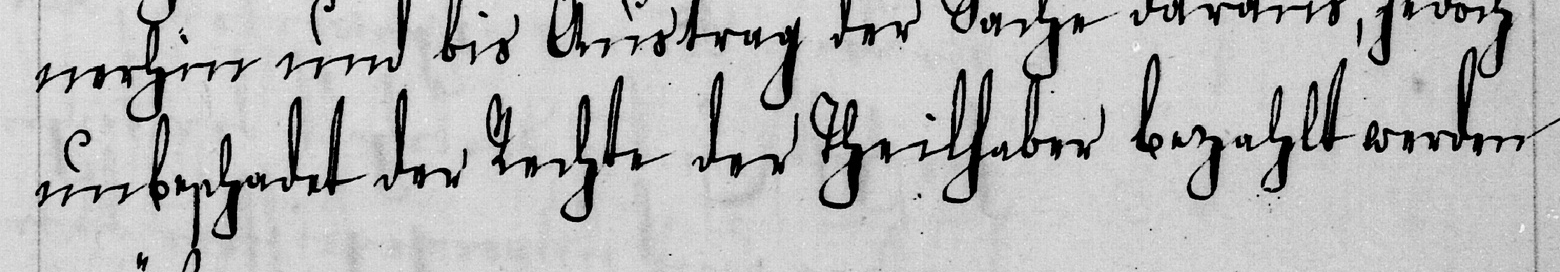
unbeschadet der Rechte der Theilhaber bezahlt werden
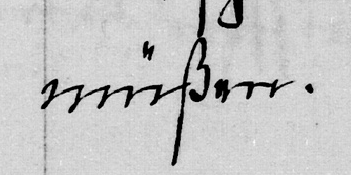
müßen.
